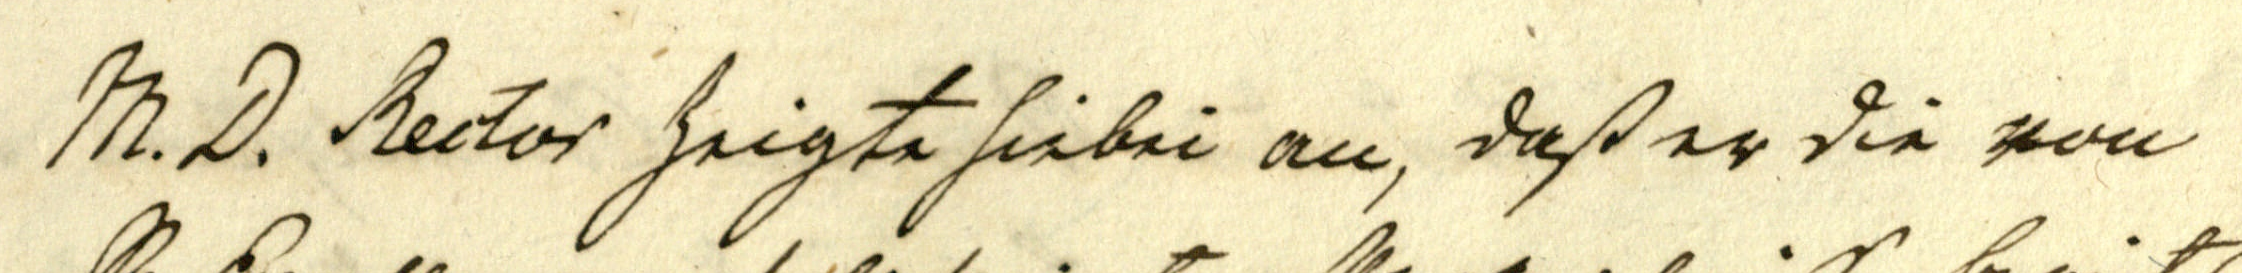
M. D. Rector zeigte hiebei an, daß er die von
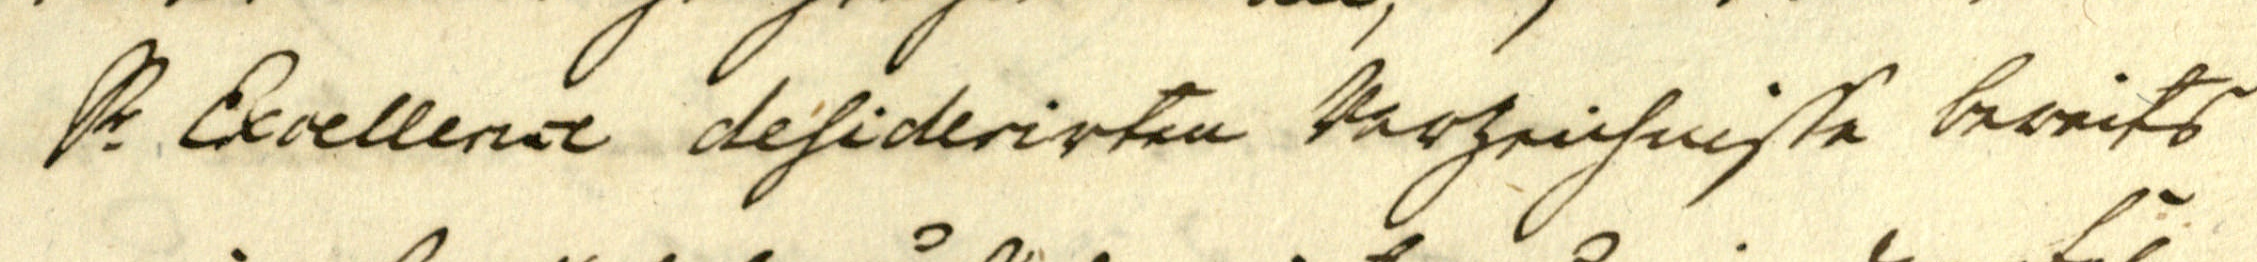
Sr. Excellence desiderirten Verzeichnisse bereits
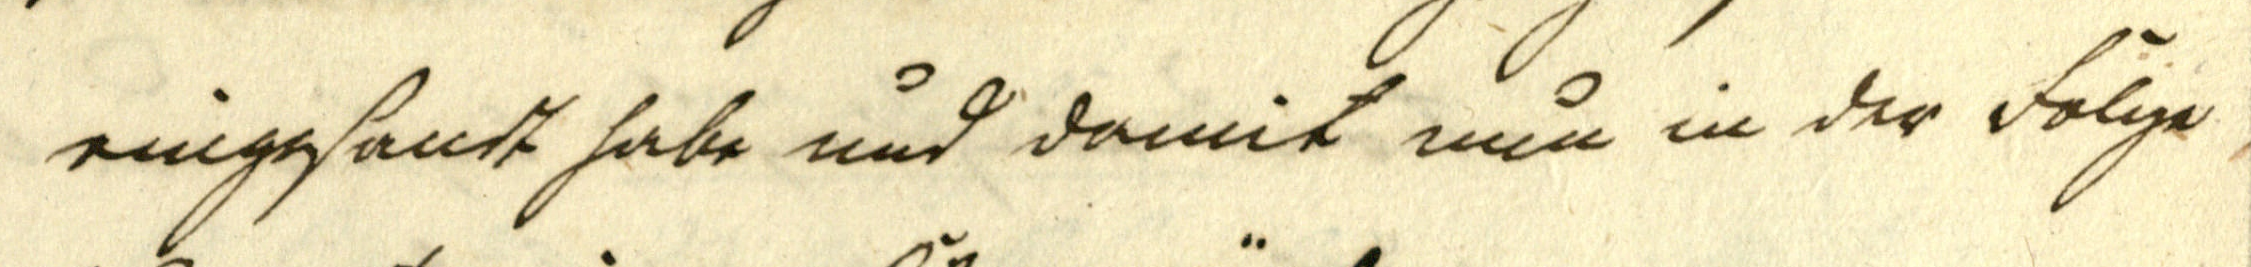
eingesandt habe und damit nun in der Folge
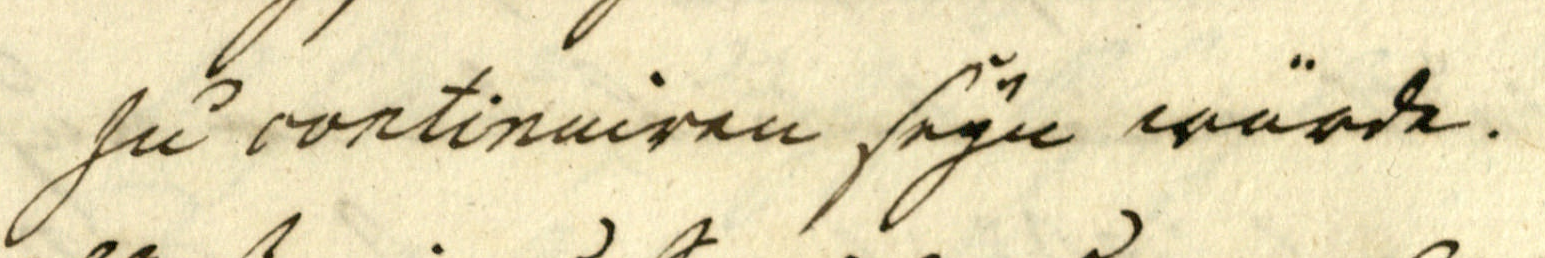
zu continuiren seÿn würde.
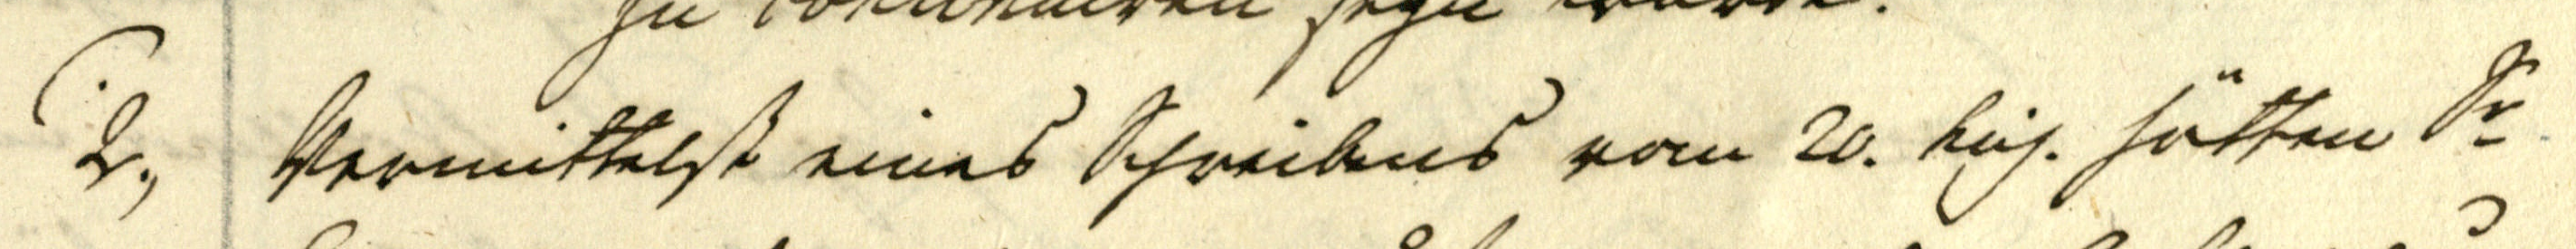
2., Vermittelst eines Schreibens vom 20. huj. hätten Sr
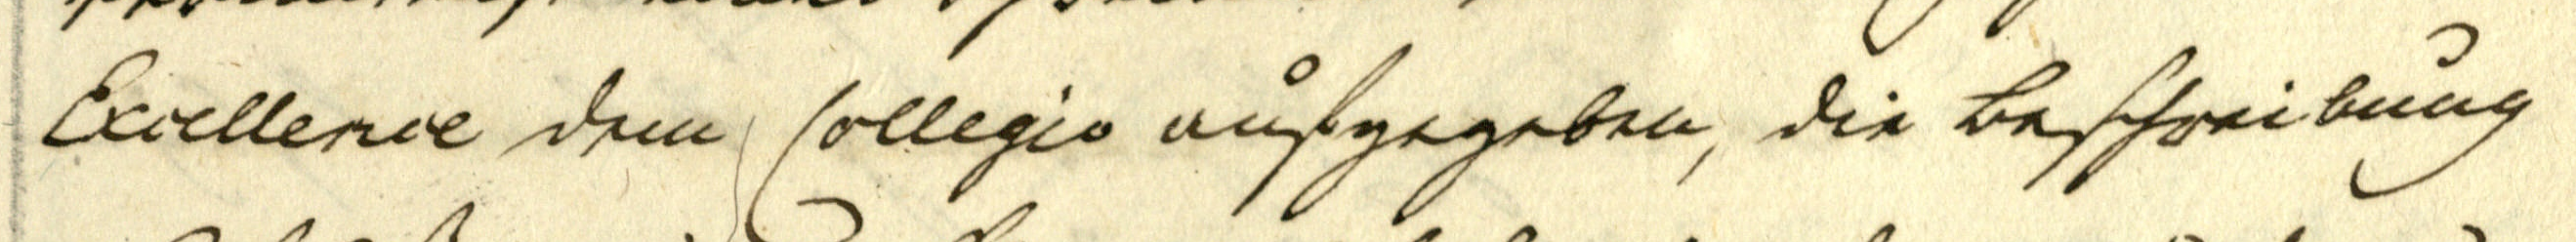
Excellence dem Collegio aufgegeben, die Beschreibung
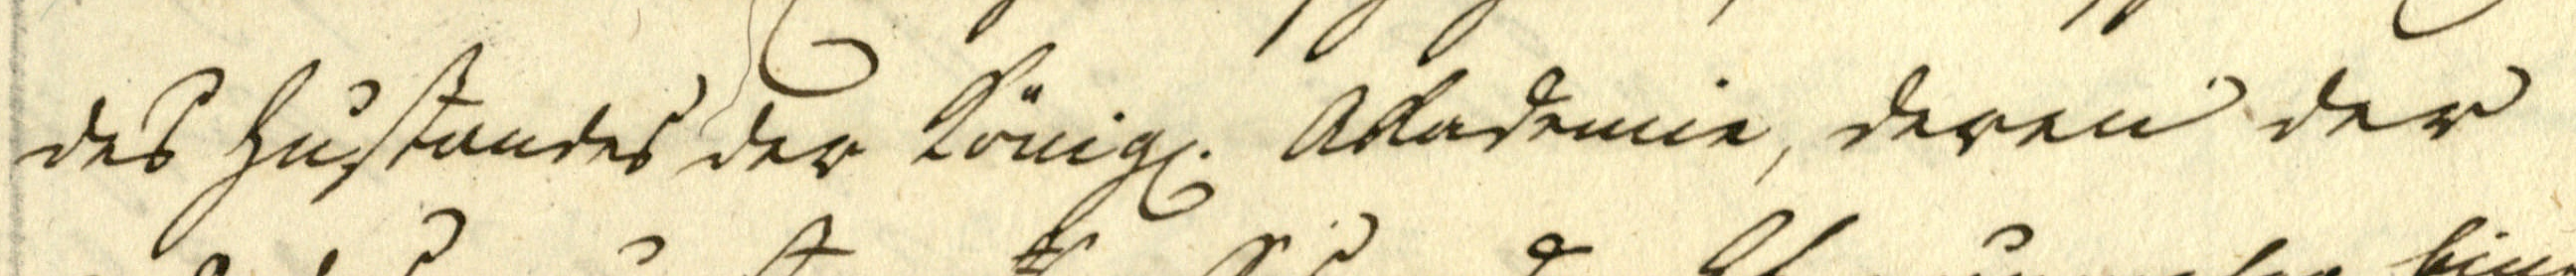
des Zustandes der Königl. Akademie, deren der
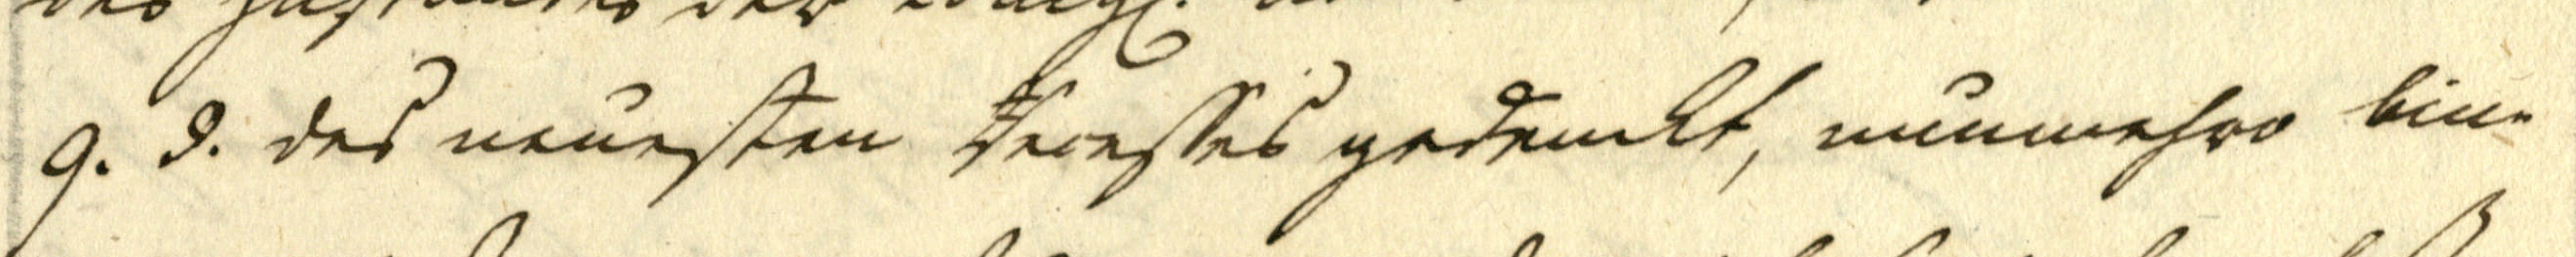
9. §. des neuesten Recesses gedenckt, nunmehro bin¬
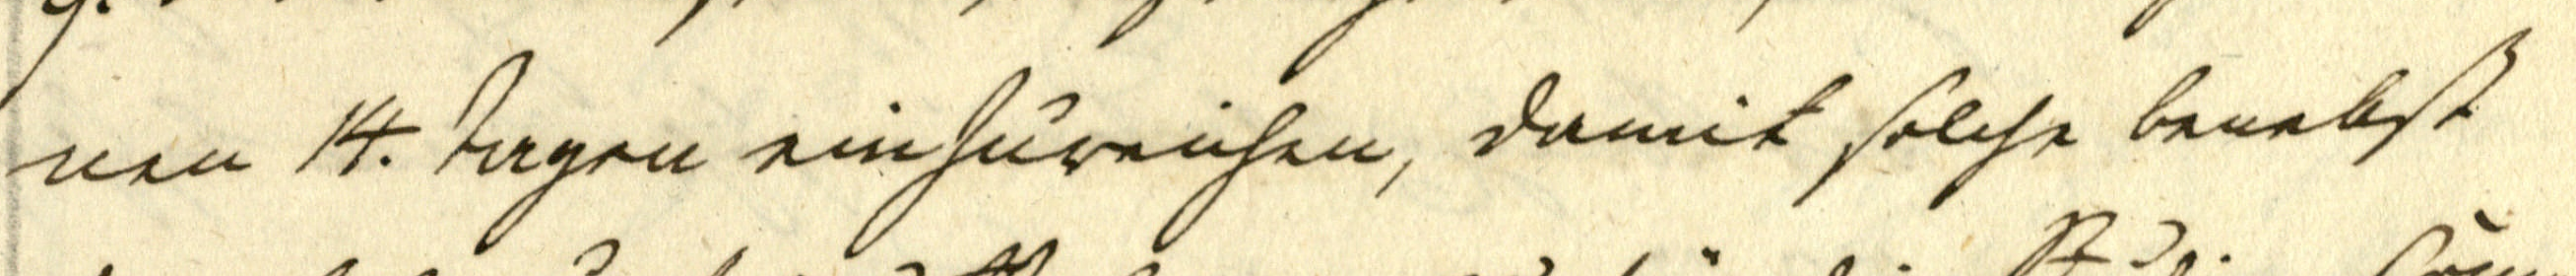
nen 14. Tagen einzureichen, damit solche benebst
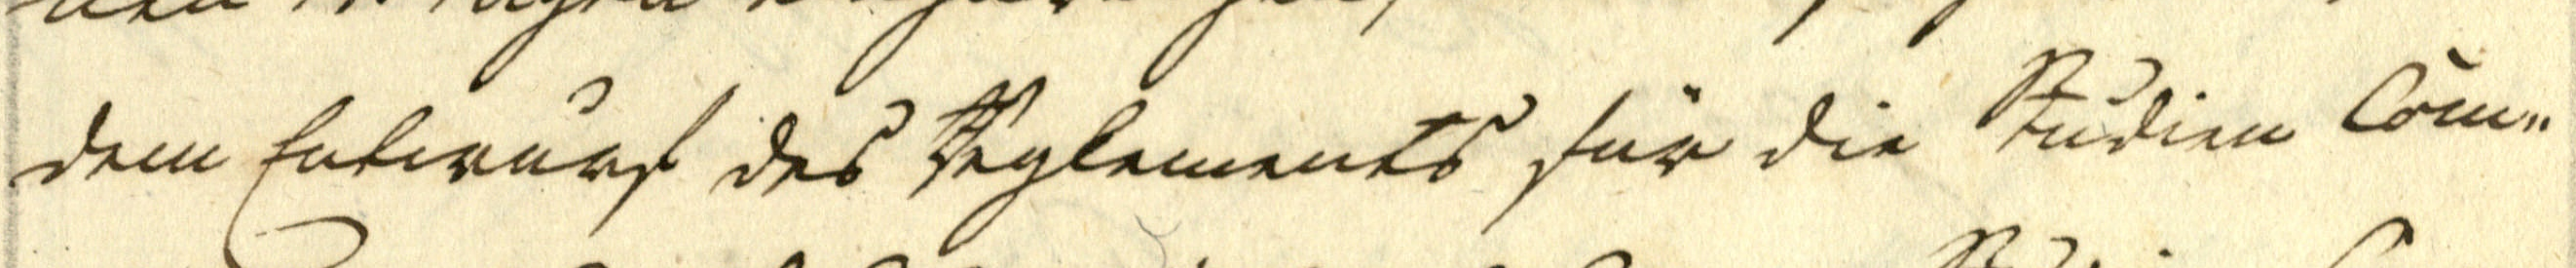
dem Entwurf des Reglements für die Studien Com¬
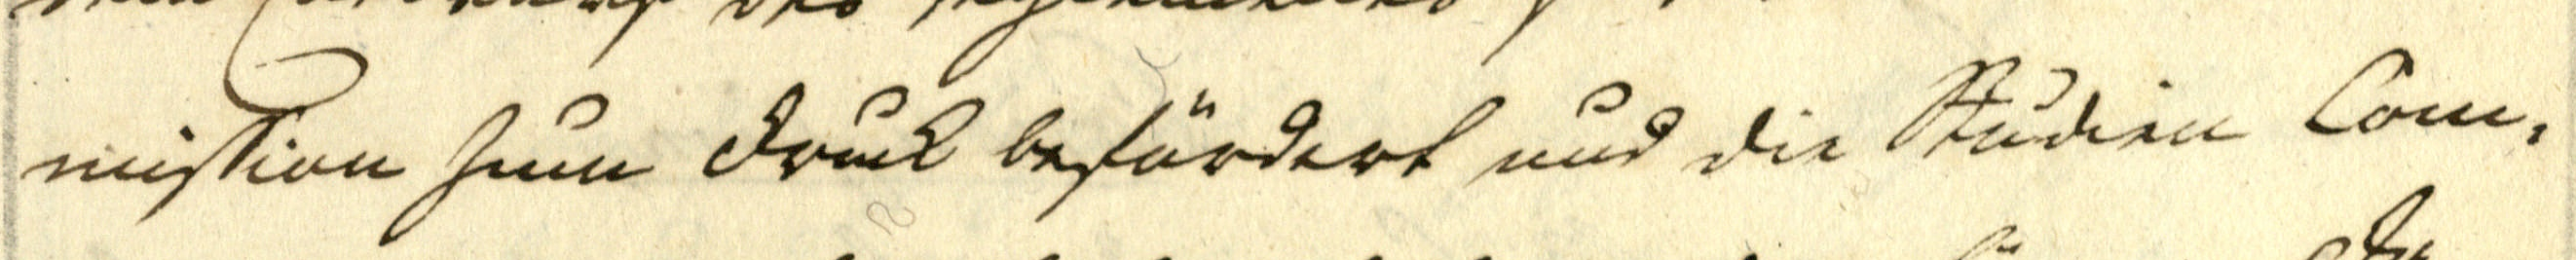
mission zum Druck befördert und die Studien Com¬
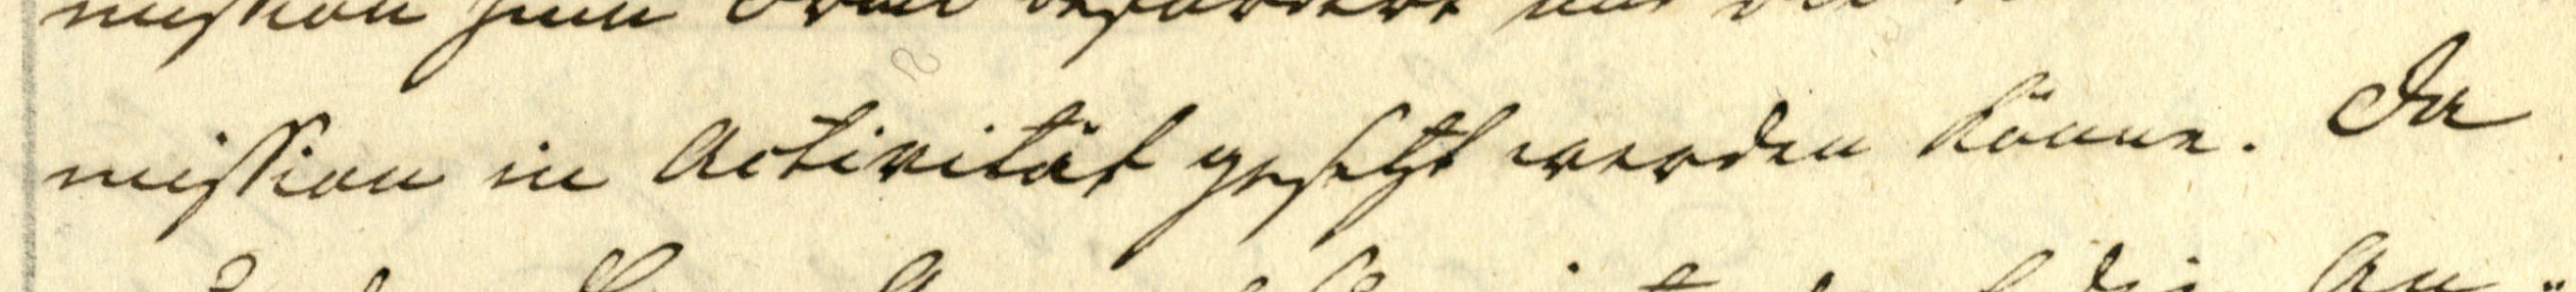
mission in Activität gesetzt werden könne. Da
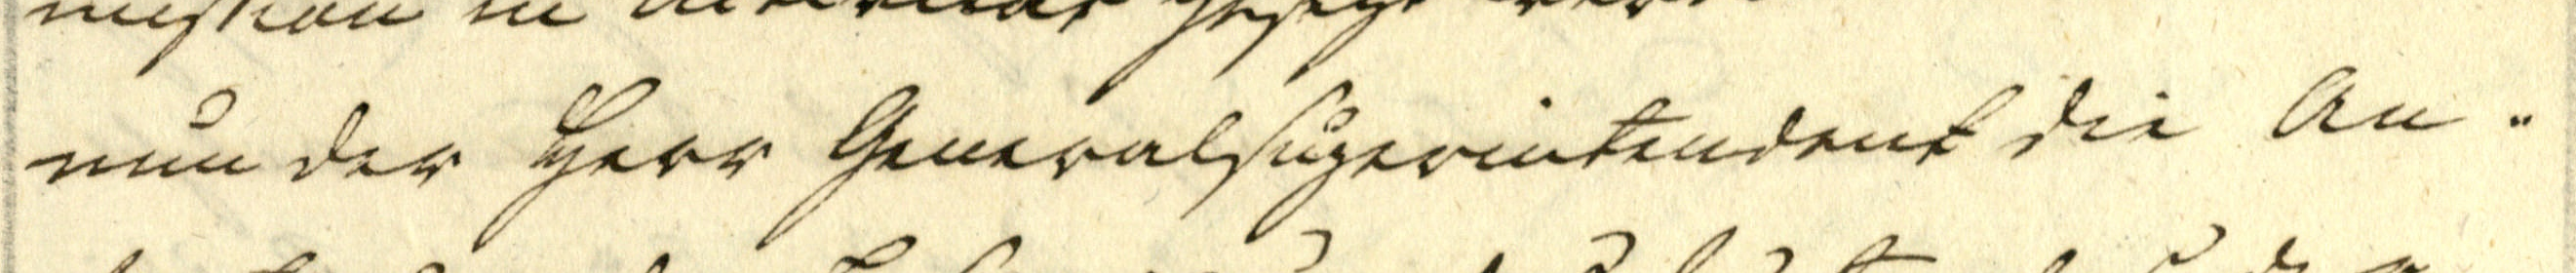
nun der Herr Generalsuperintendent die An¬
